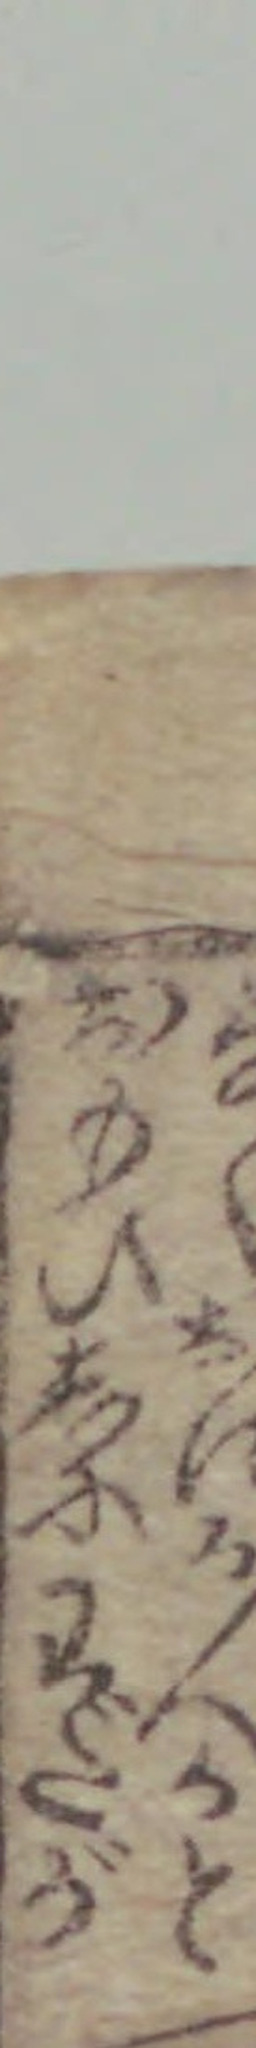おもひしにわだが
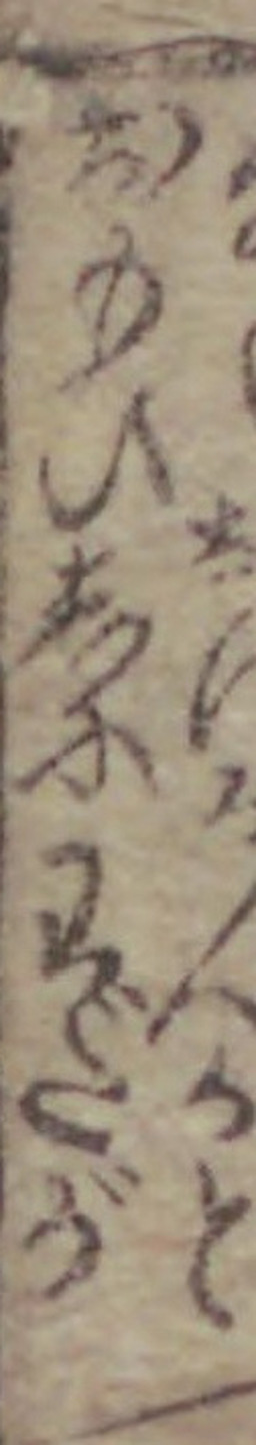おもひしにわだが
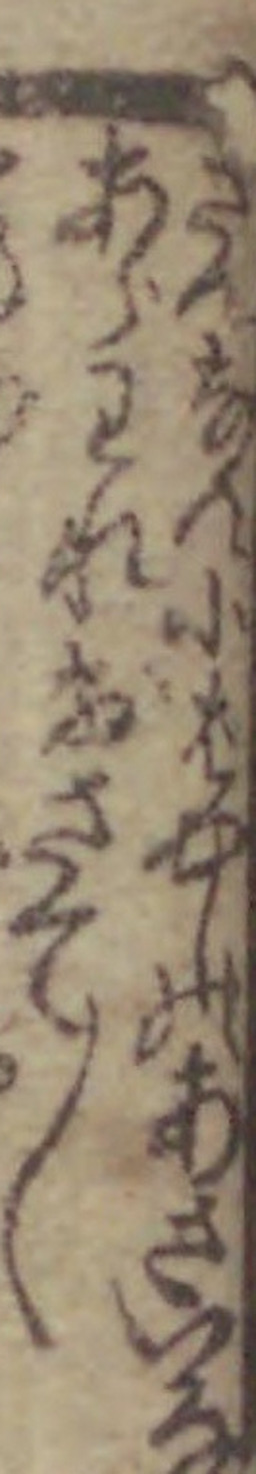あらわれるさて〳〵
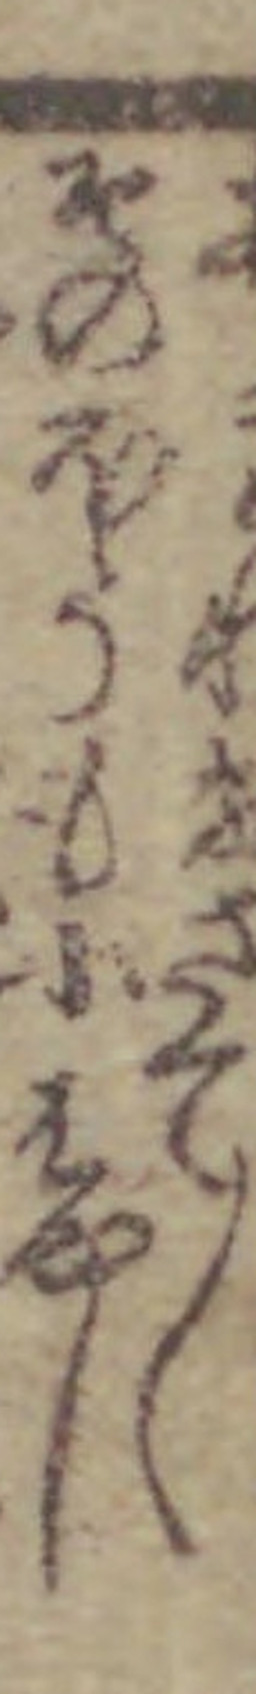そのほうも小はやし
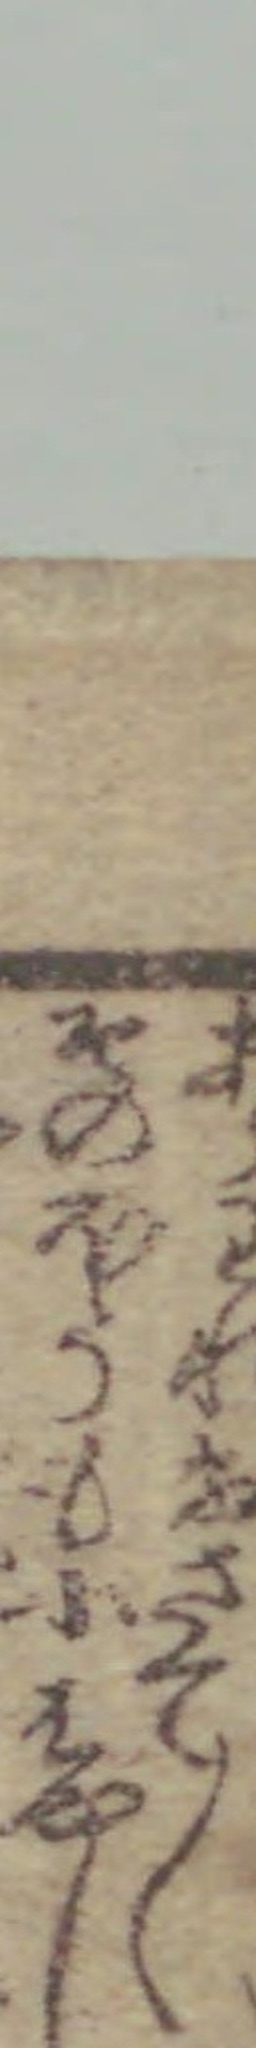そのほうも小はやし
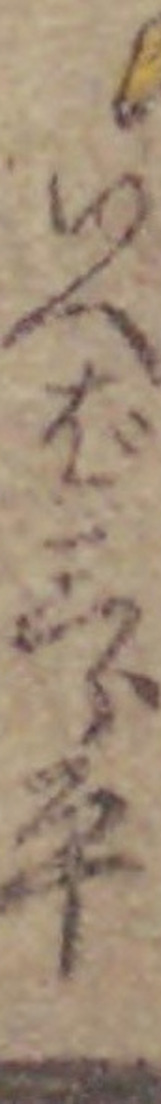いへば三郎平
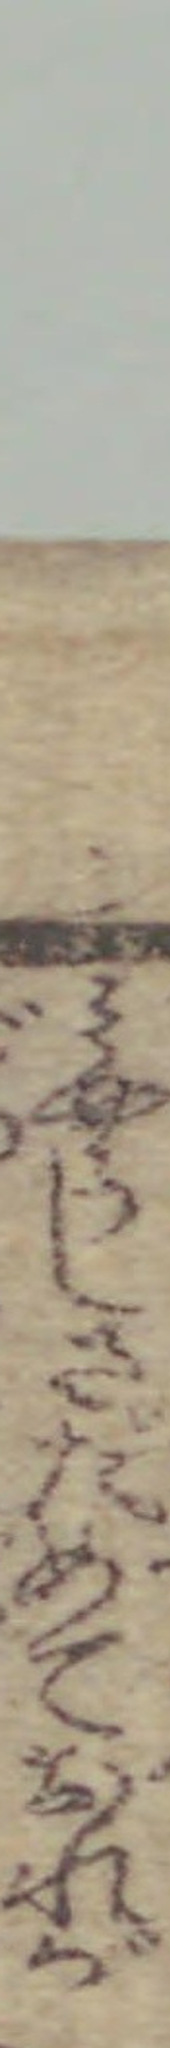みやうしさだめておれが
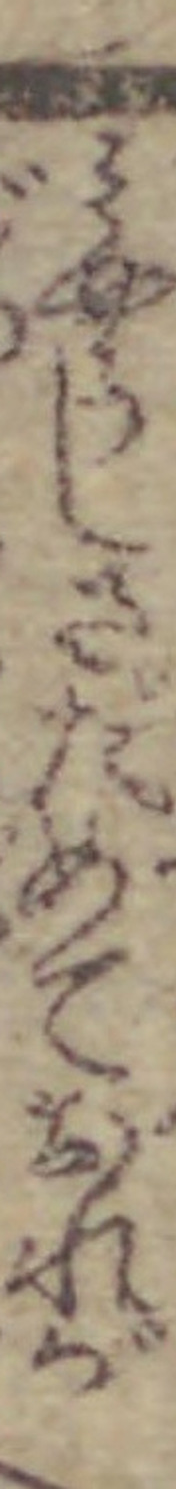みやうしさだめておれが
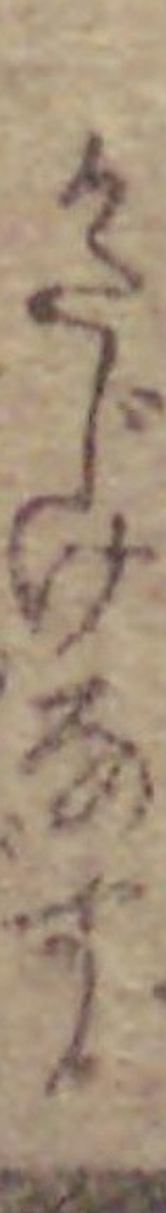かたじけなす
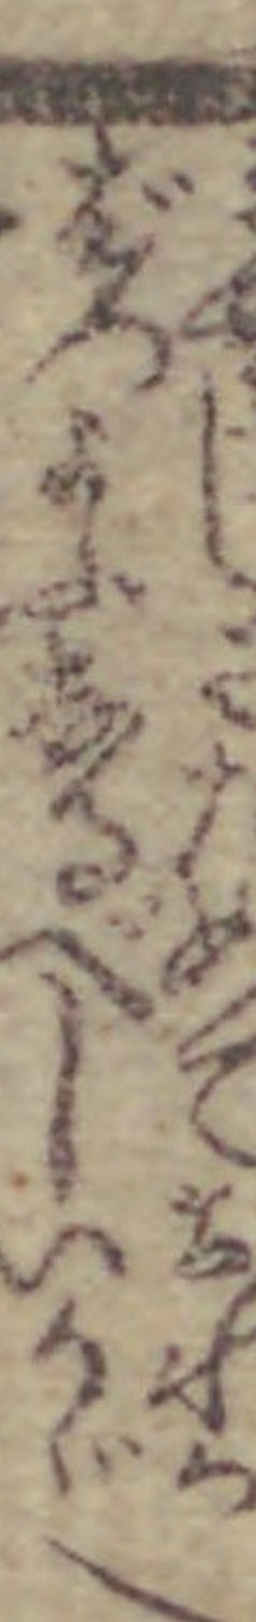ばつよふなるべしいかゞ
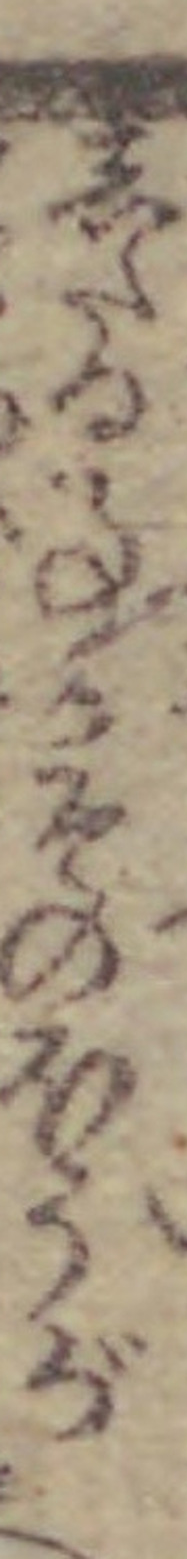したる事かそのほうが
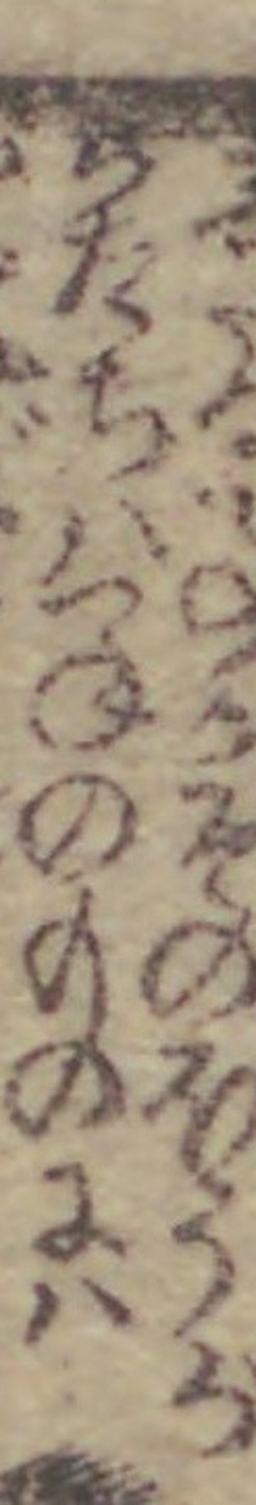らたちはつねのものには
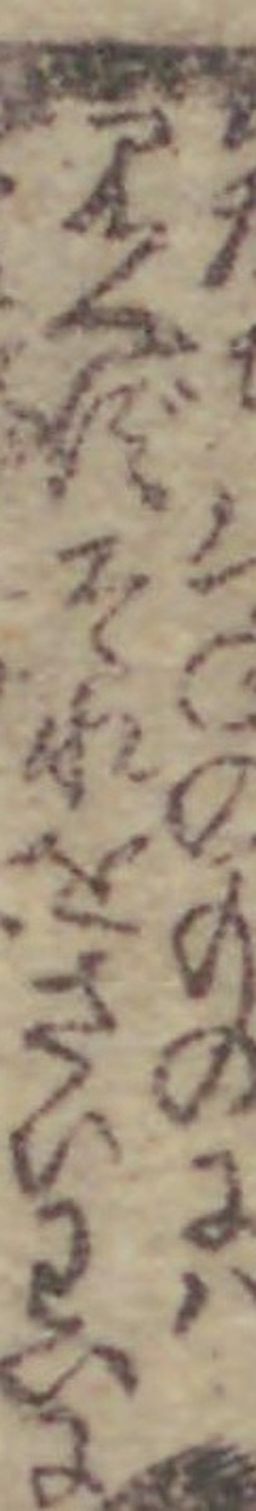見へずそれをさいわいに
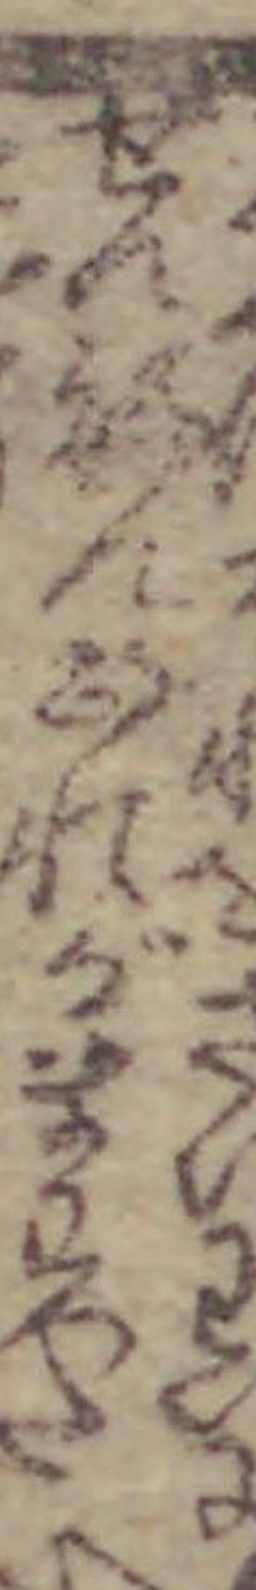せんねんおれがまわつた
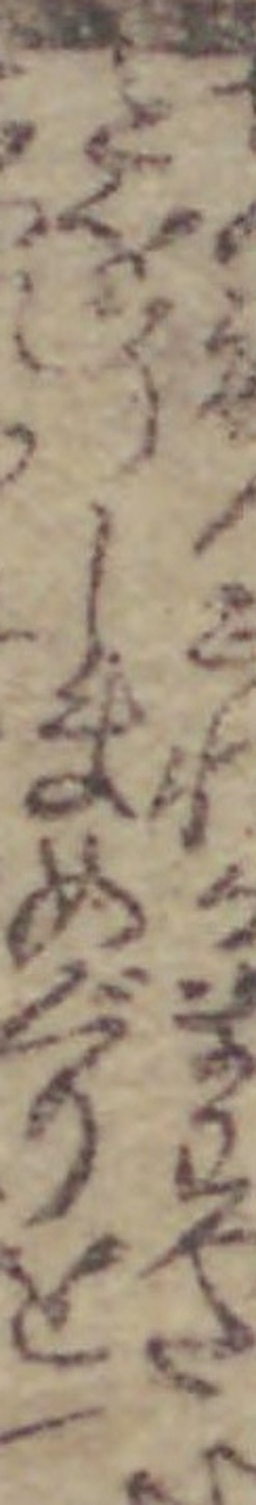とをりしまめぐりを
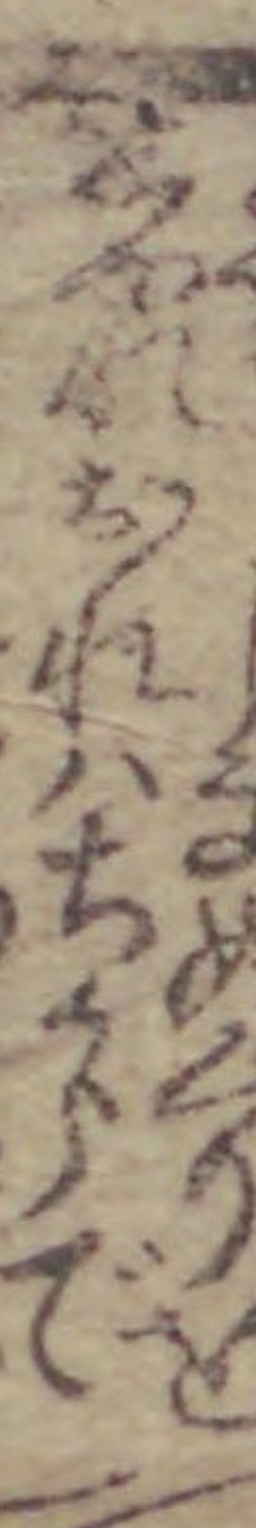しやれおれはちからで
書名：近頃嶋めぐり 3巻
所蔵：国立国会図書館 National Diet Library, JAPAN
